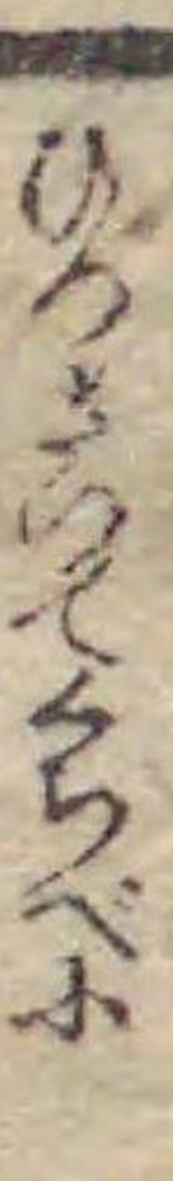ひつさいてくちべに
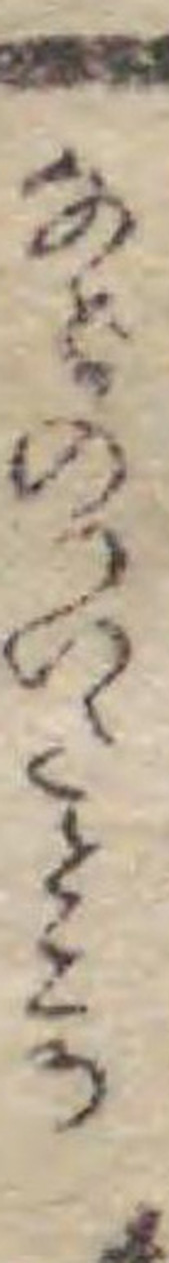などのついたところ
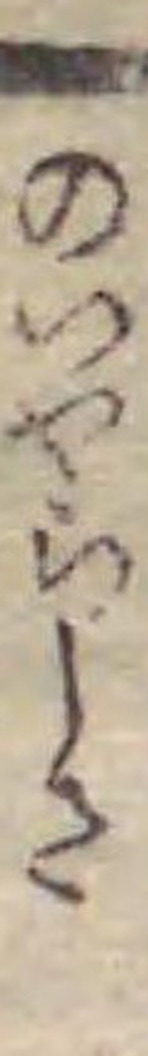のいやらしさ
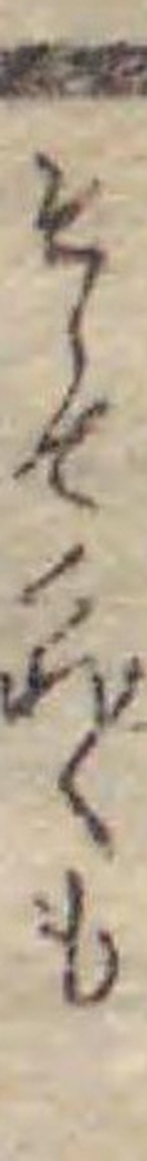そしてくれ〴〵も
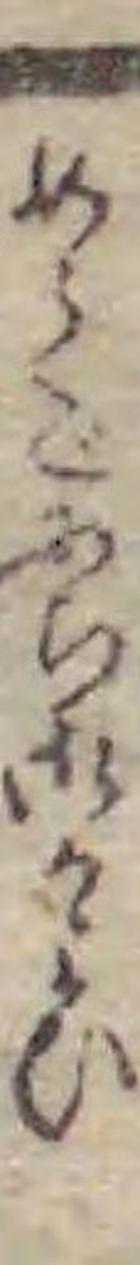めうごにち御かよひ
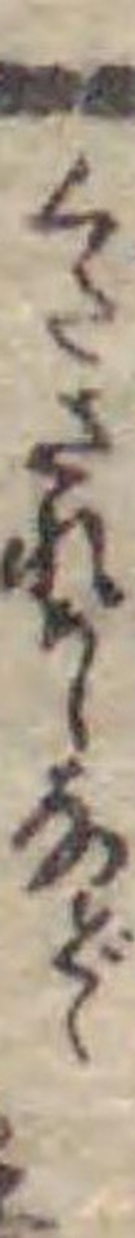くたされかしなどゝ
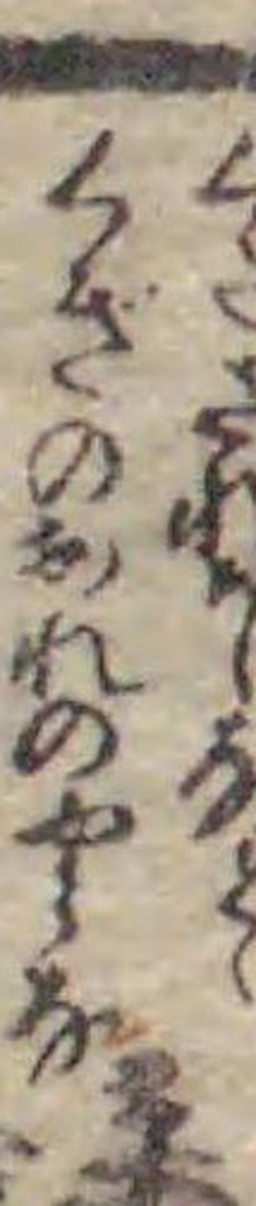くぎのおれのやうな
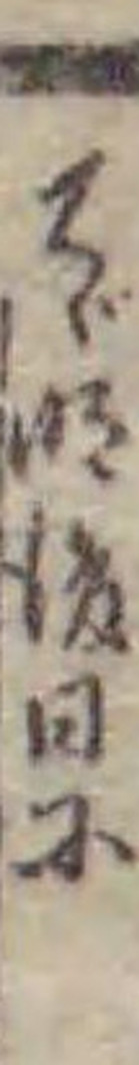てヾ明後日に
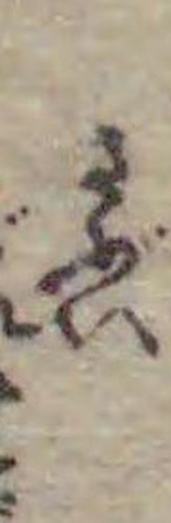さぶい
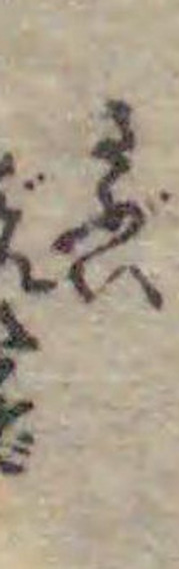さぶい
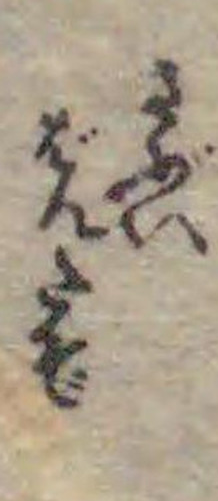ばんたぞ
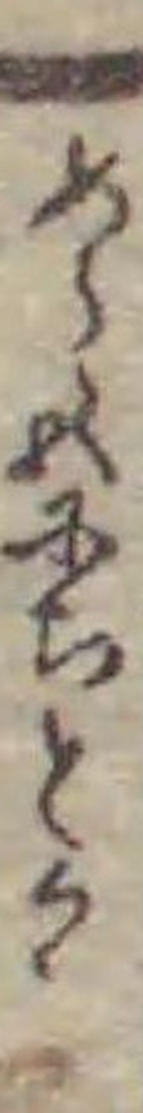めう五にちとかく
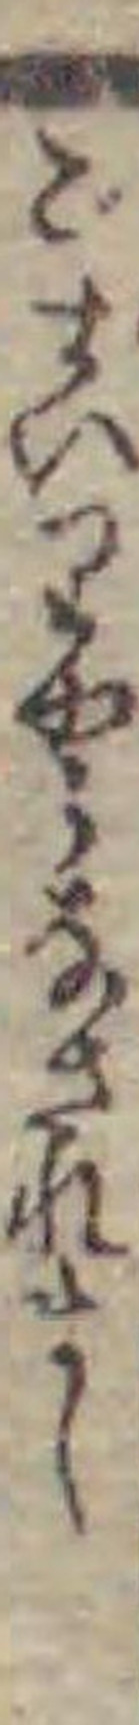ごすいりやうなされまし
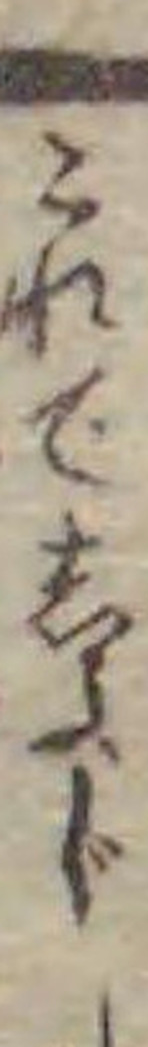これでしよじ
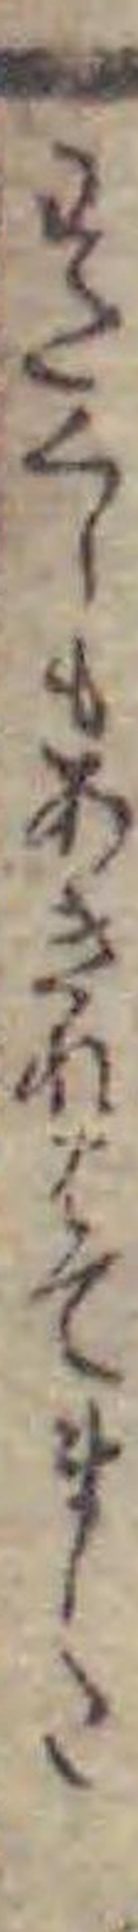わたくしもあきれはてました

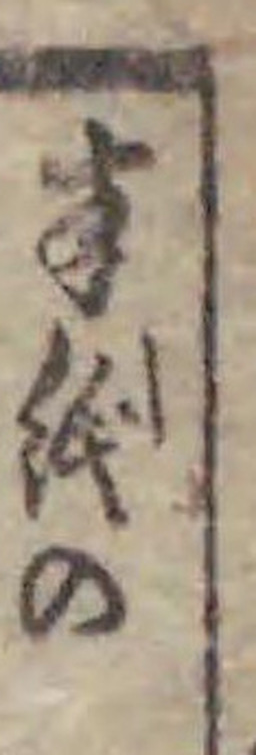半紙の
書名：紙屑身上噺 : 3巻
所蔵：国立国会図書館 National Diet Library, JAPAN
